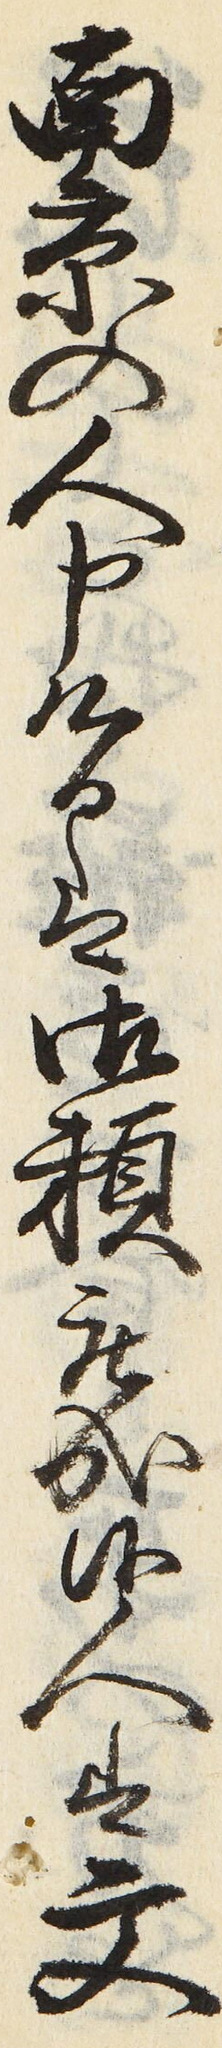南京の人申けるは御頼被成候人は文
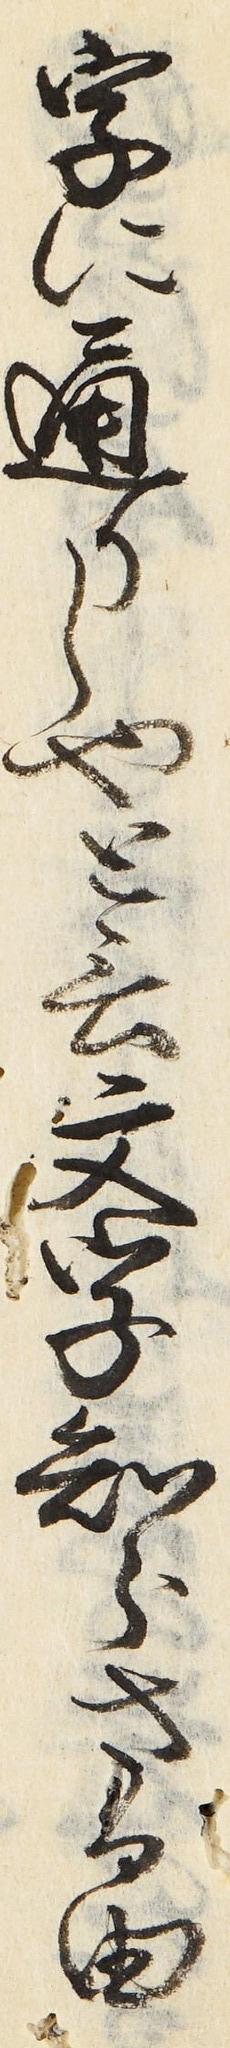字に通りしやと云文字知らざる由
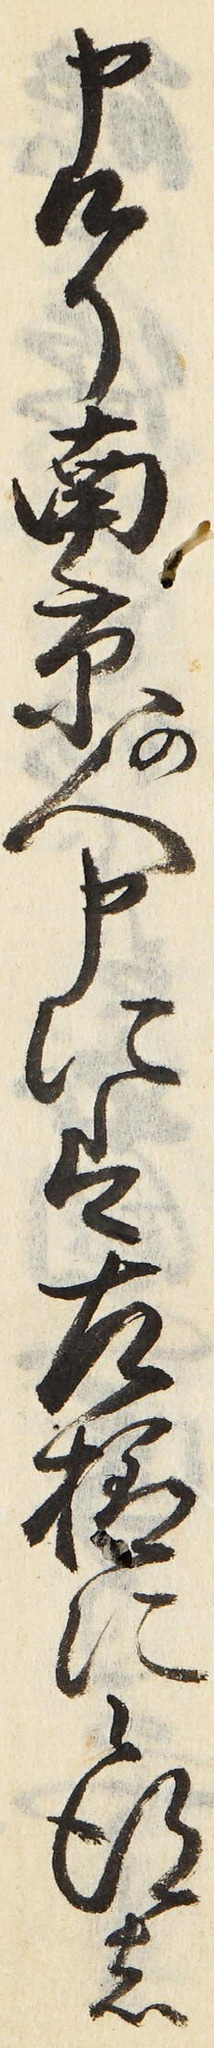申けり南京の人申には左様に候得は
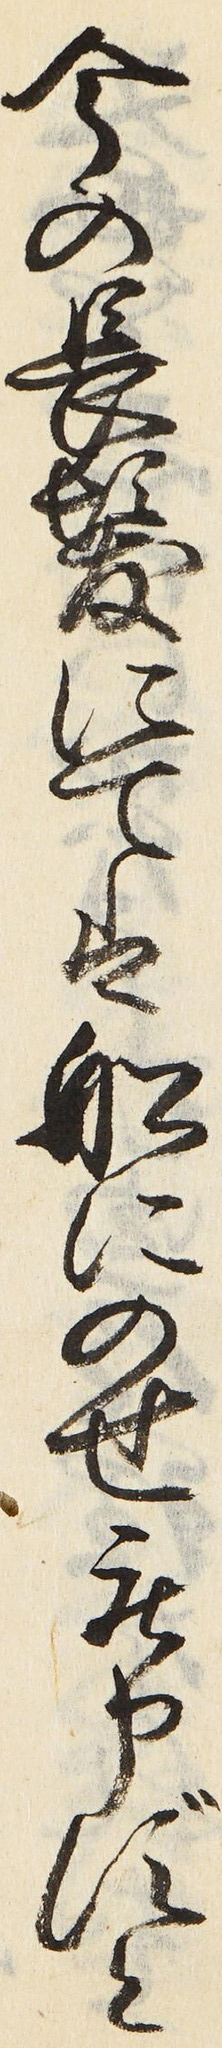今の長髪にては船にのせ被申ずと
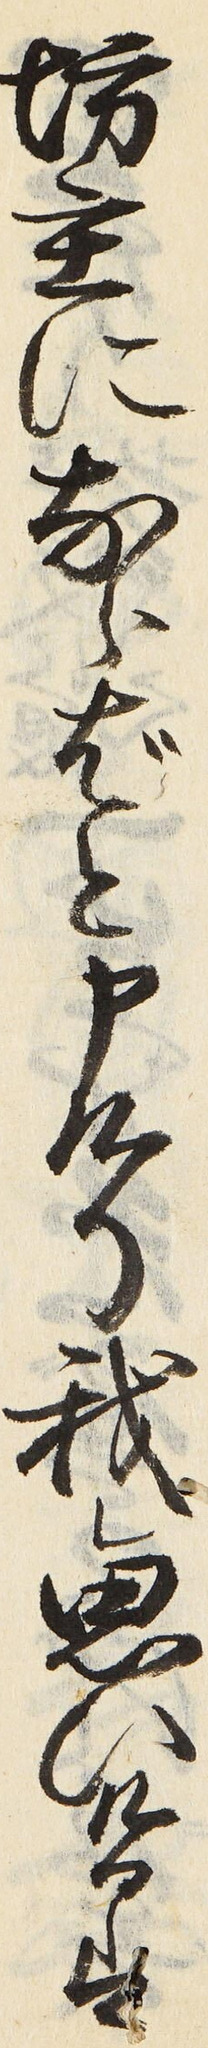坊主にならばと申けり我れ思ひけるは
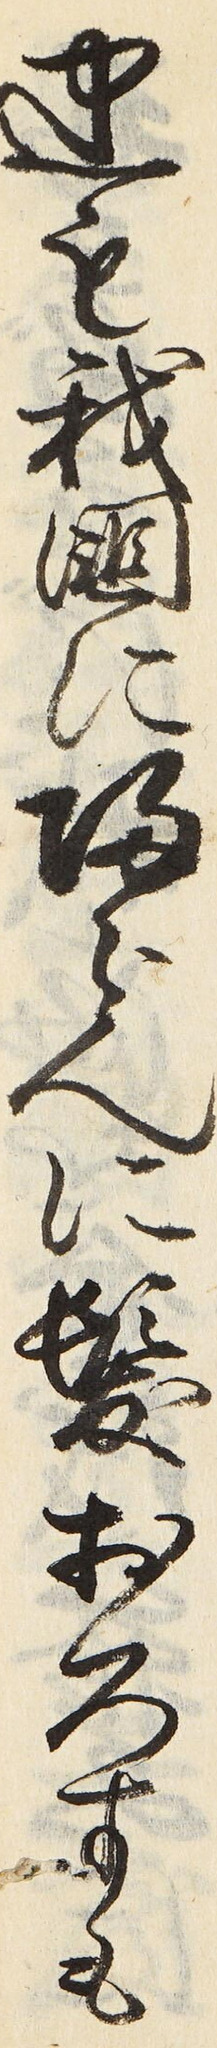迚も我国に帰らんに髪おろすも
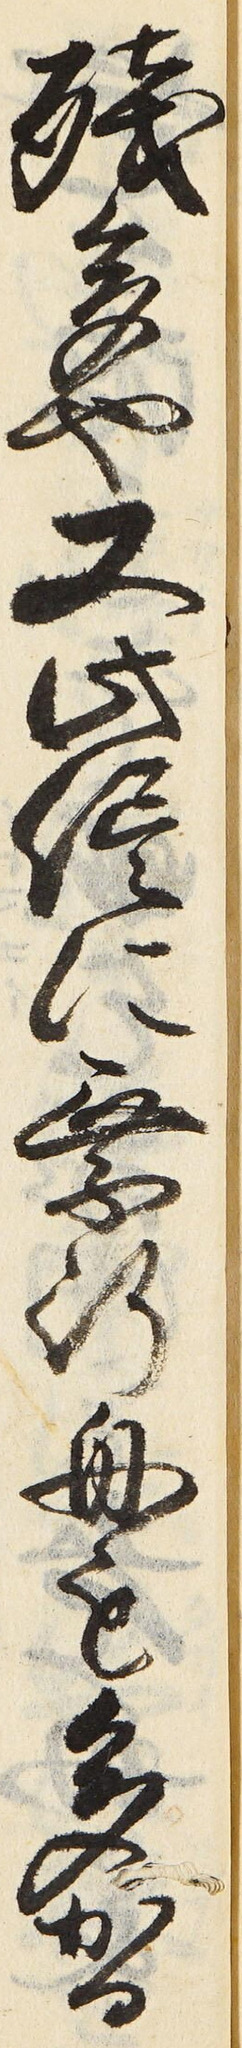残多や又此侭に乗行舟も多かる
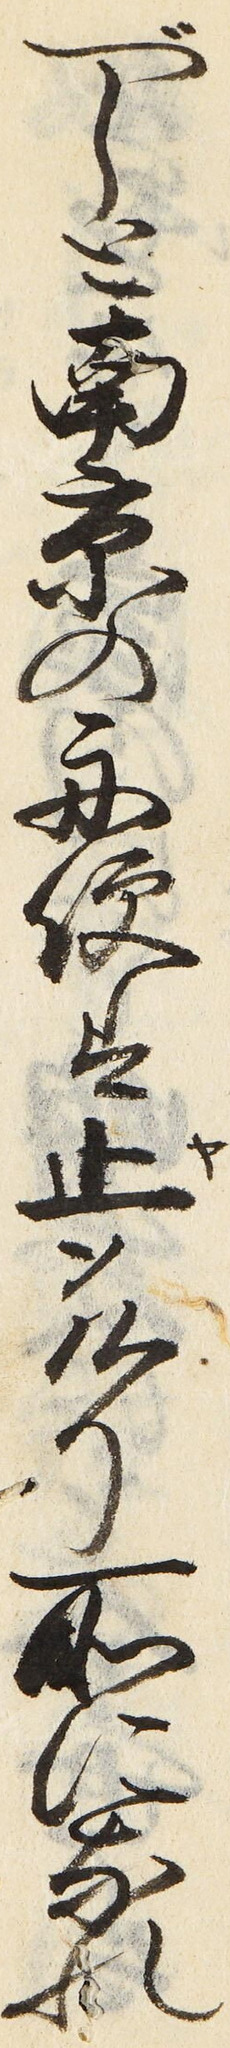べしと南京の船便は止めけり所になれ
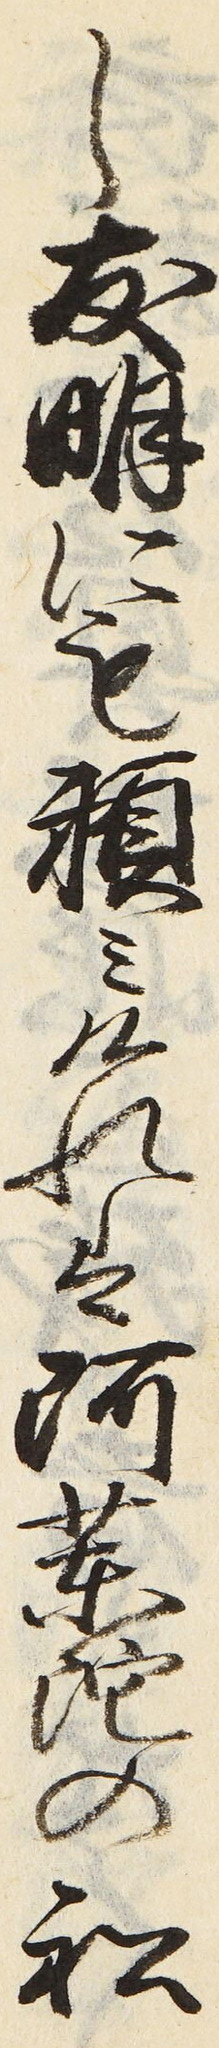し友朋にも頼みけれは阿蘭陀の船
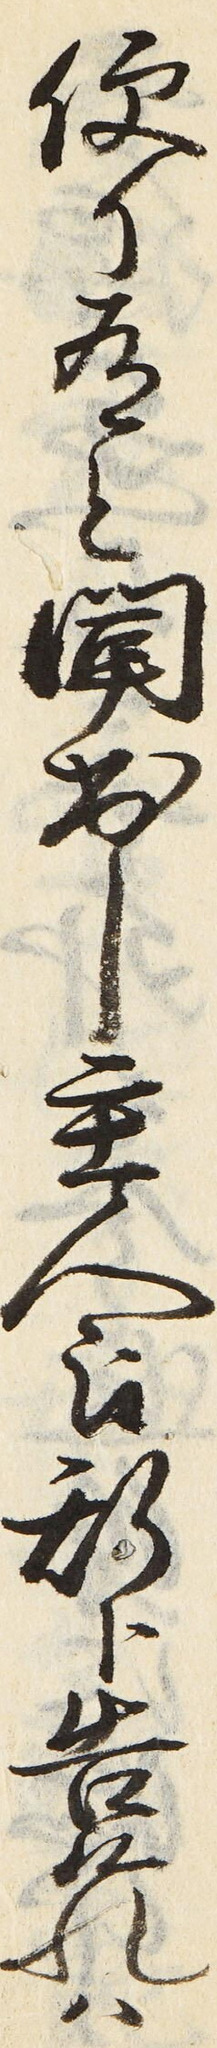便り有と聞出し主人江斯と告けれは
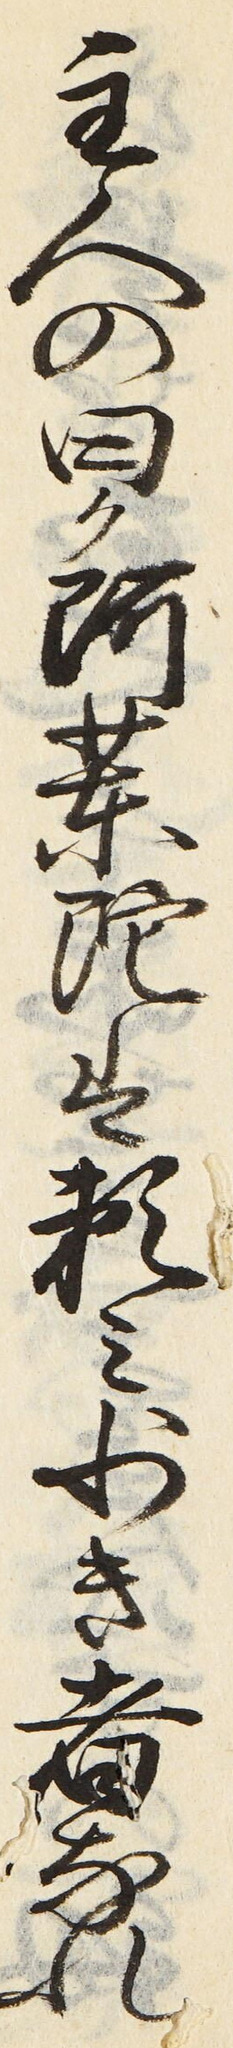主人の曰く阿蘭陀は頼み少き者なれ
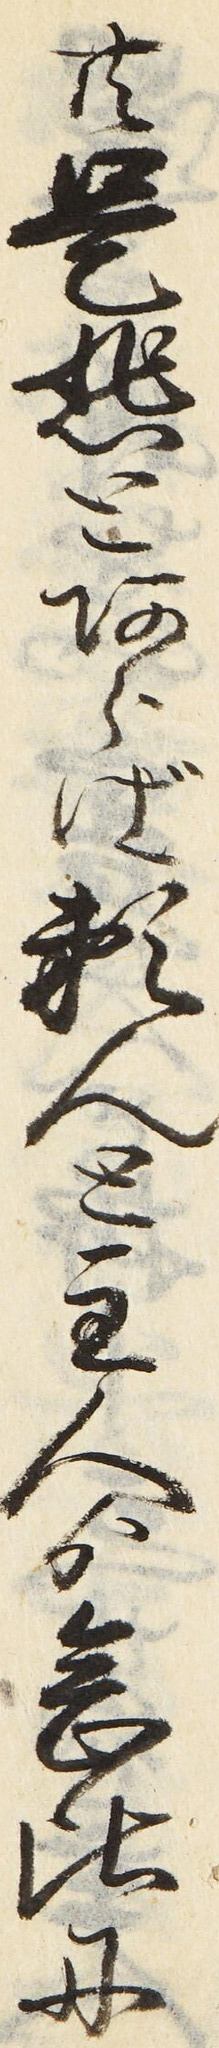共是悲とあらば頼んと主人ゟ念頃に
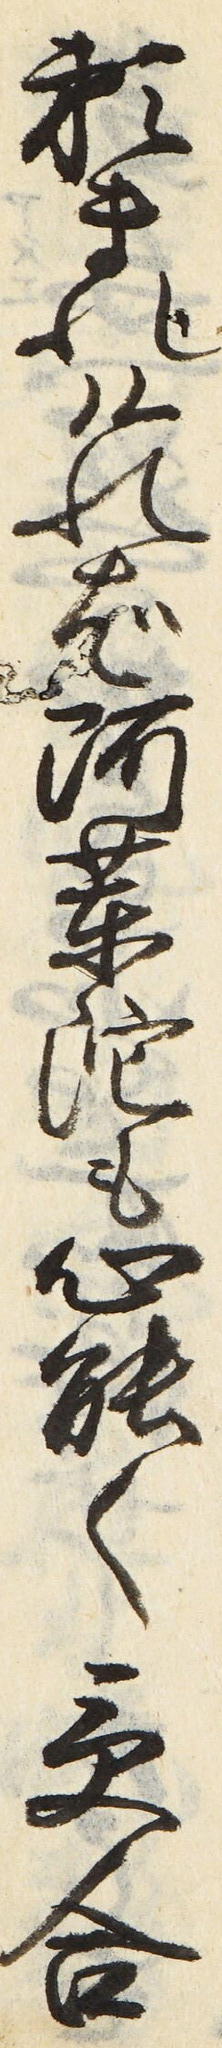頼まれければ阿蘭陀も心能く受合
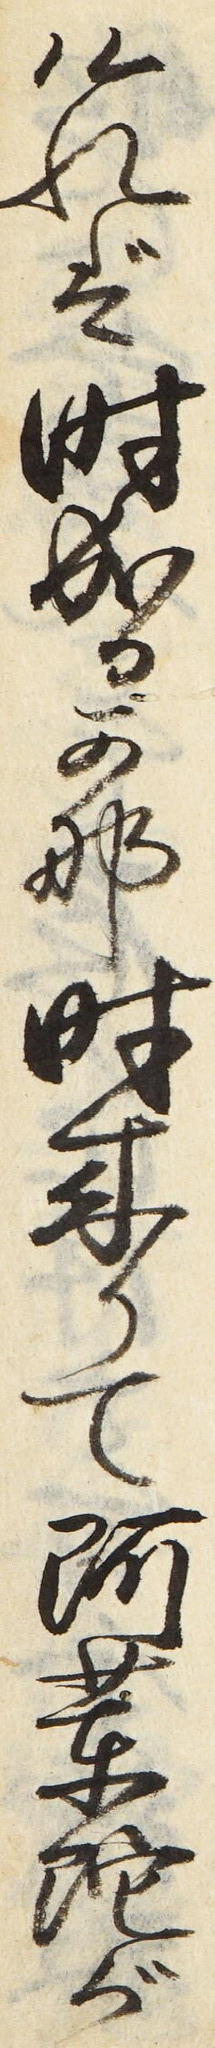ければ時成るかな時来りて阿蘭陀が

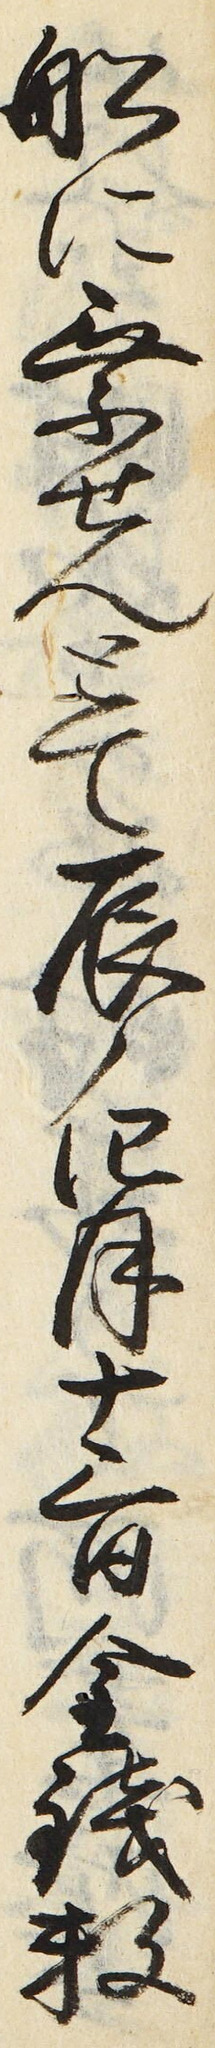船に乗せんとて辰の四月十三日金銭数
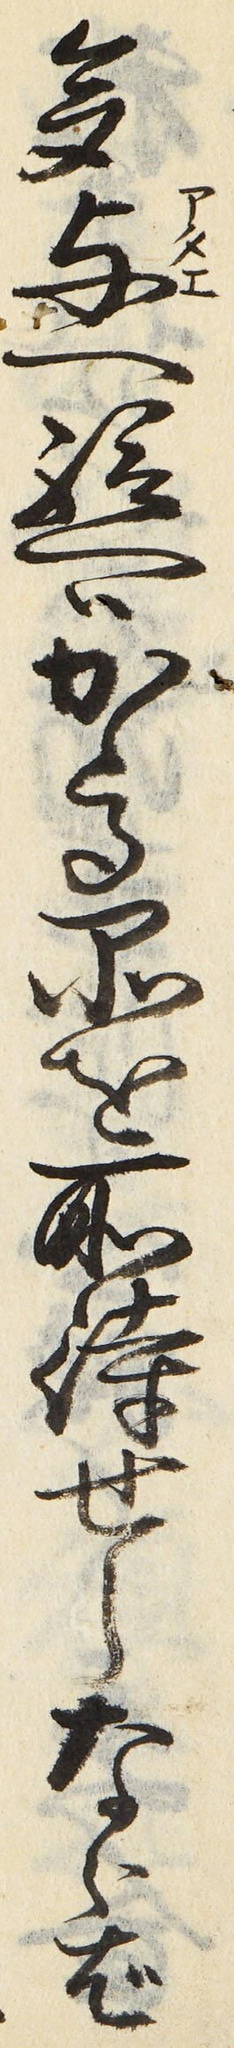多与へ給へはかゝる品を所持せしならば
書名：華夷九年録
